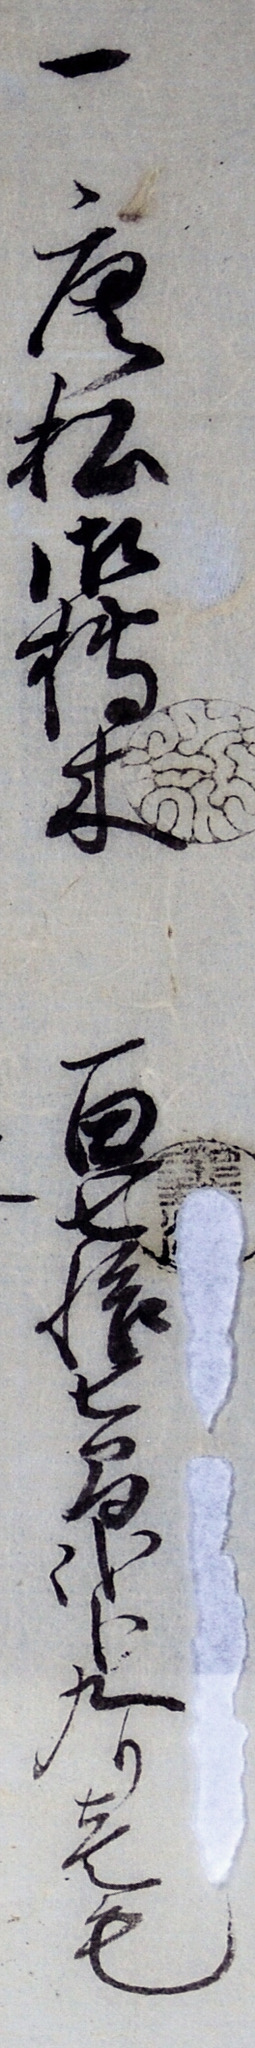一唐松御榑木百七拾七間弐分九り壱毛
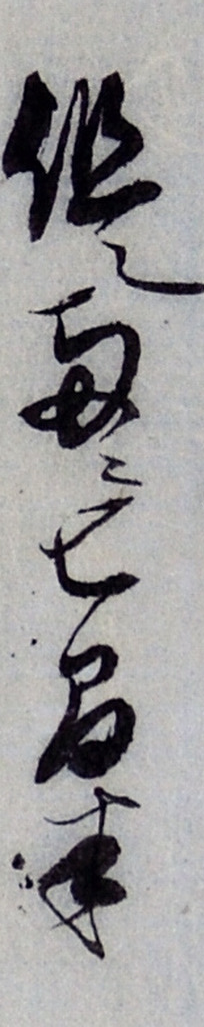但シ両ニ七間半
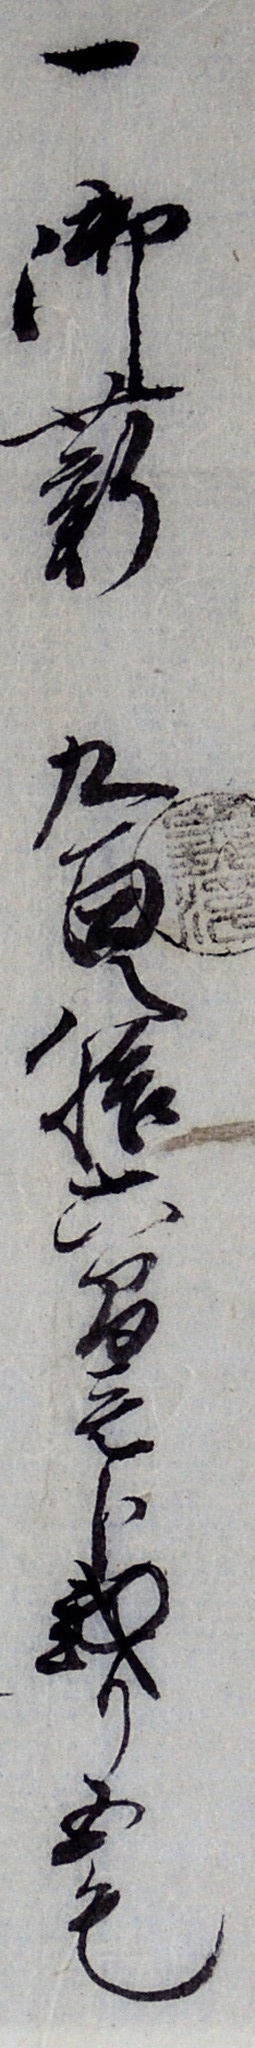一御薪九百八拾六間壱分弐り五毛
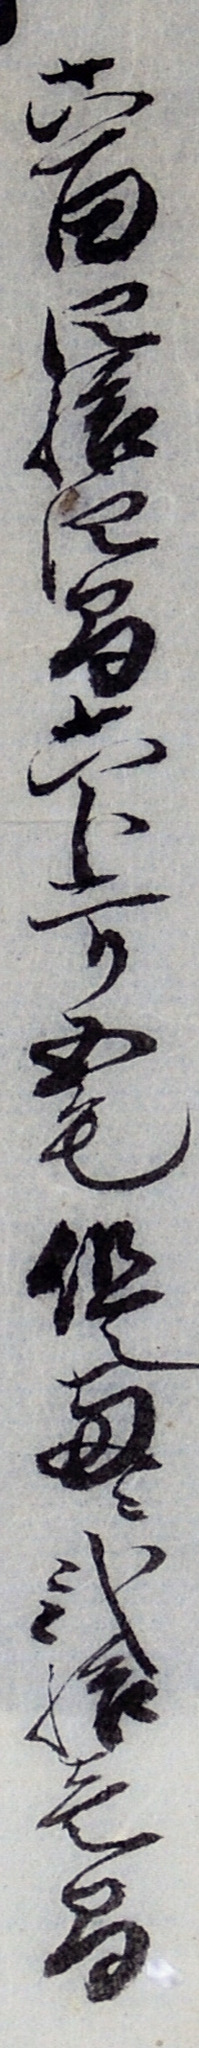内六百四拾四間六分二り五毛但シ両ニ弐拾壱間
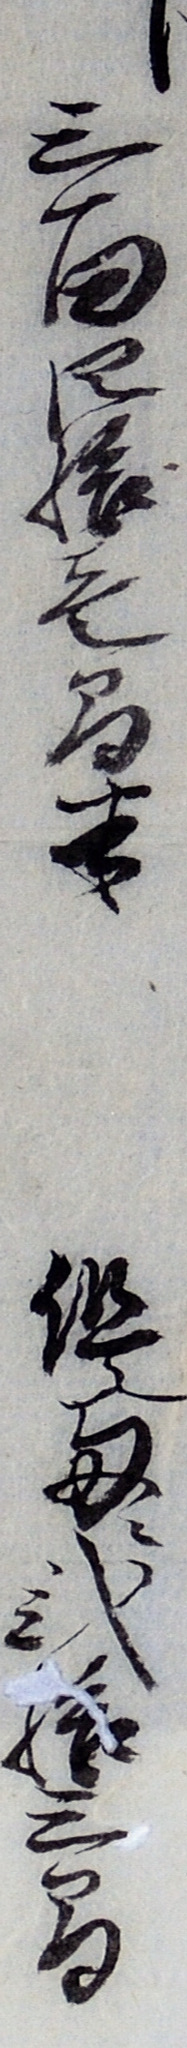三百四拾壱間半但シ両ニ弐拾三間
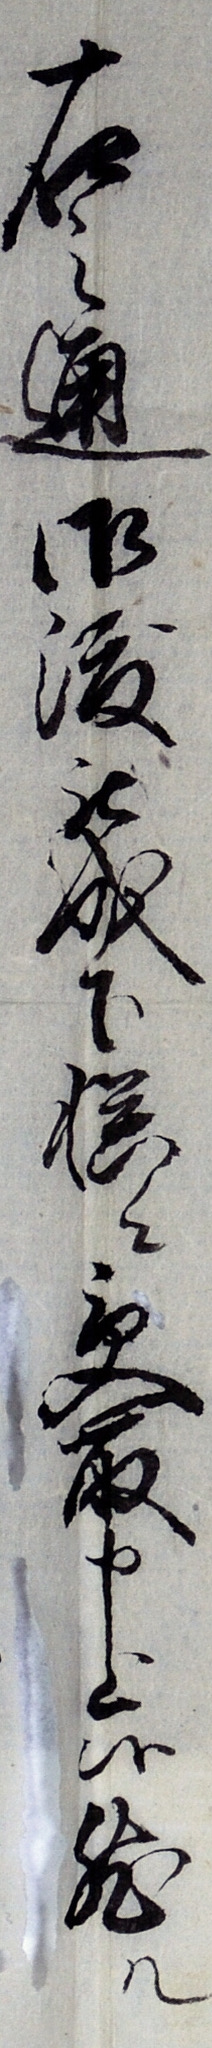右之通御渡被成下慥ニ受取申上候然ル
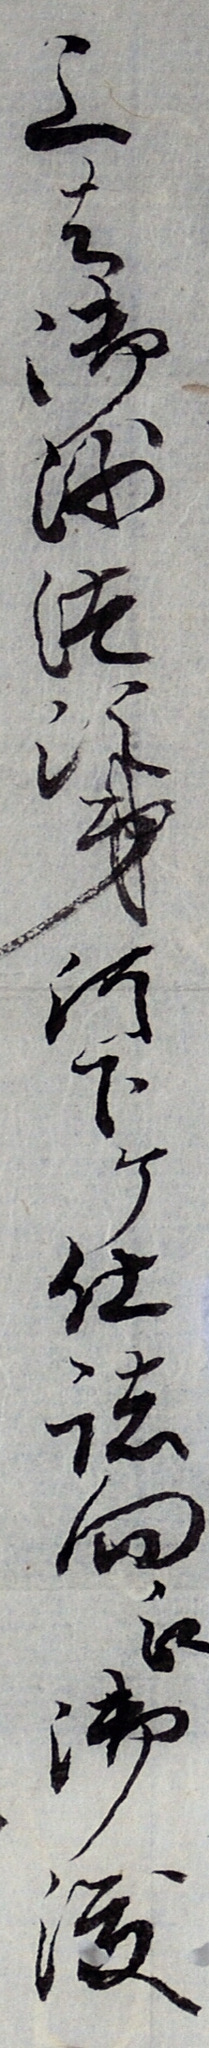上者御沙汰次第河下ケ仕諸向江御渡
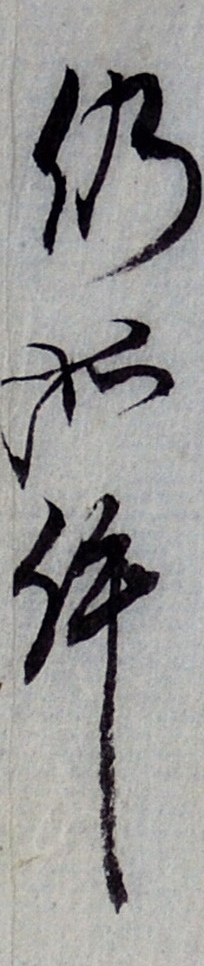仍如件
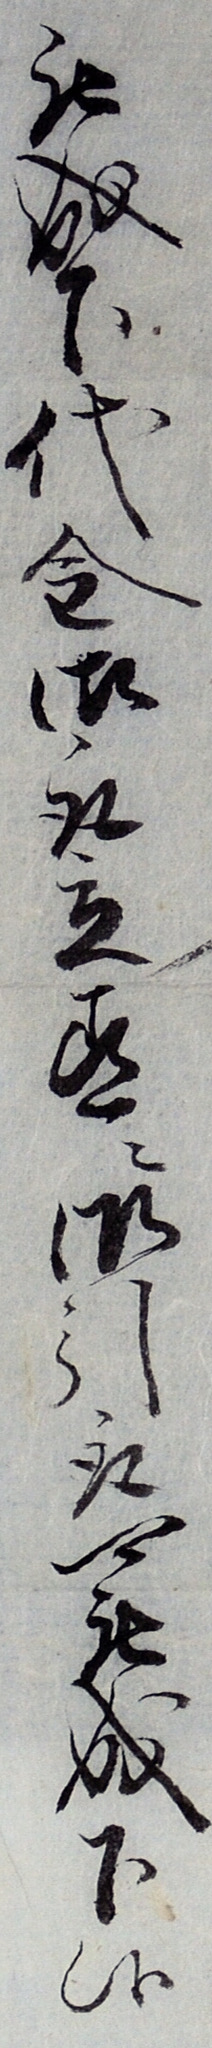被成下代金御取立直ニ御引取可被成下候
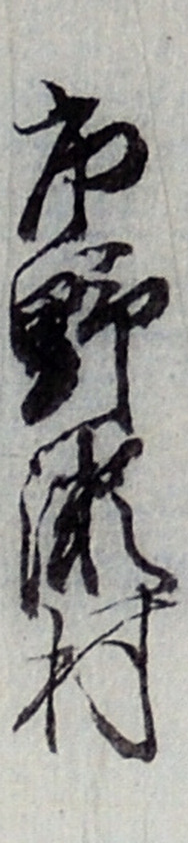市野瀬村
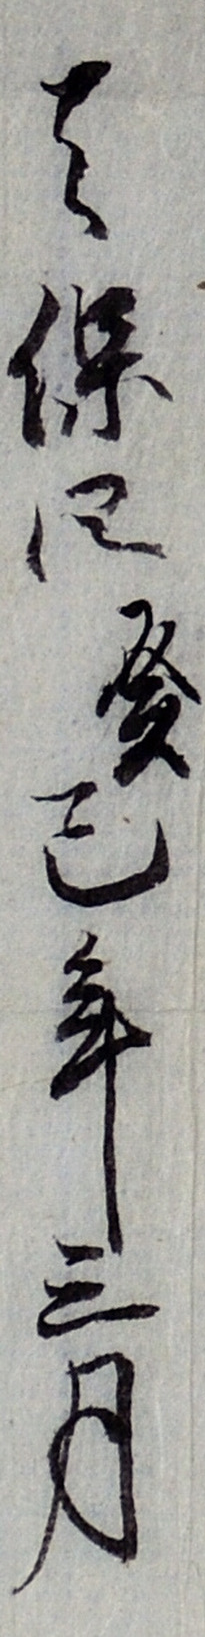天保四癸巳年三月
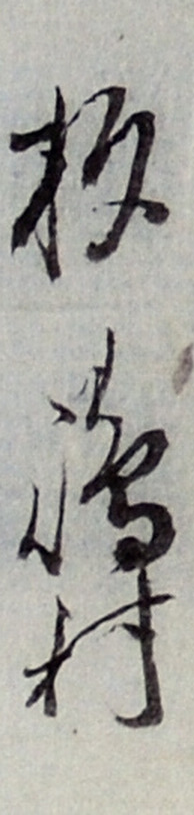杉嶋村
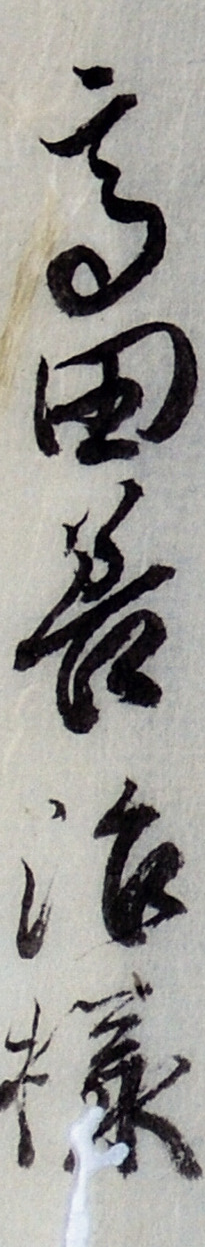高田善治様
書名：覚
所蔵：伊那市立高遠町図書館・合同会社AMANE
